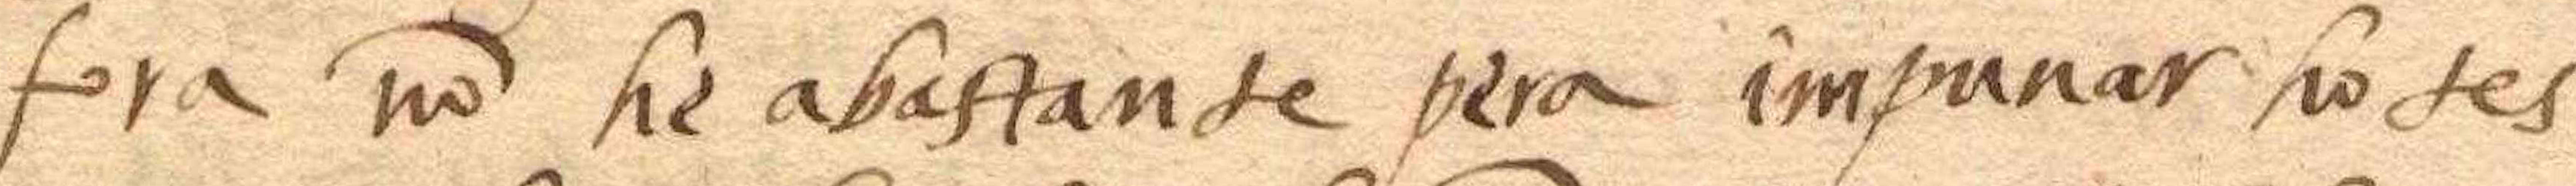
fora n̄o he abastante pera impunar ho tes
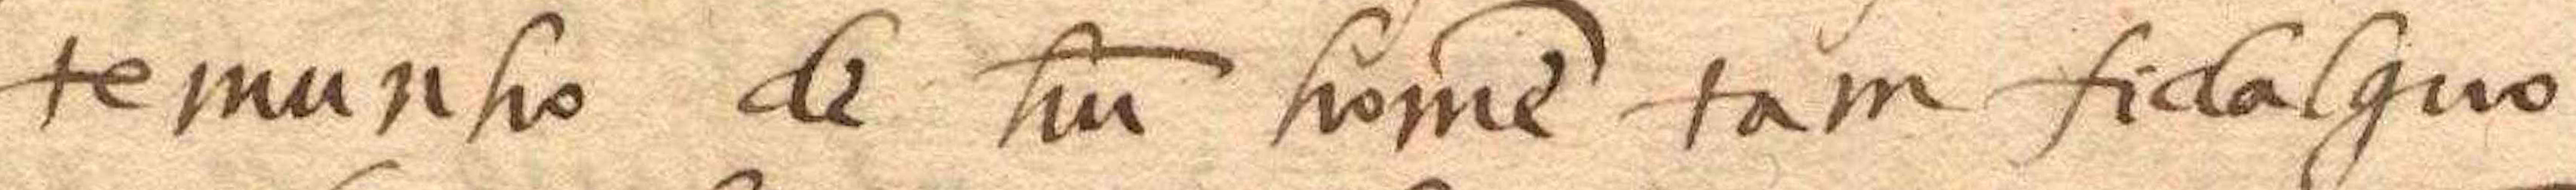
temunho de hū homē tam fidalguo
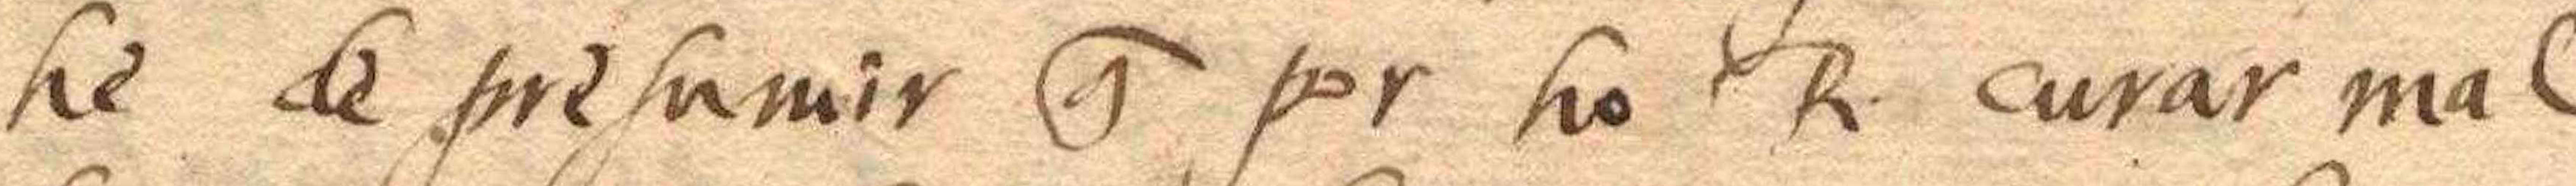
he de presumir q̄ por ho R curar mal
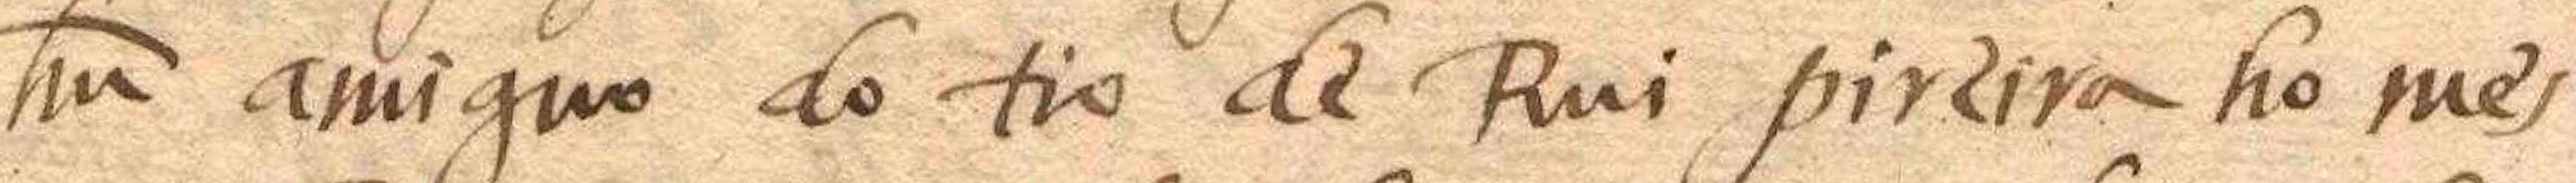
hū amiguo do tio de Rui pireira ho mes
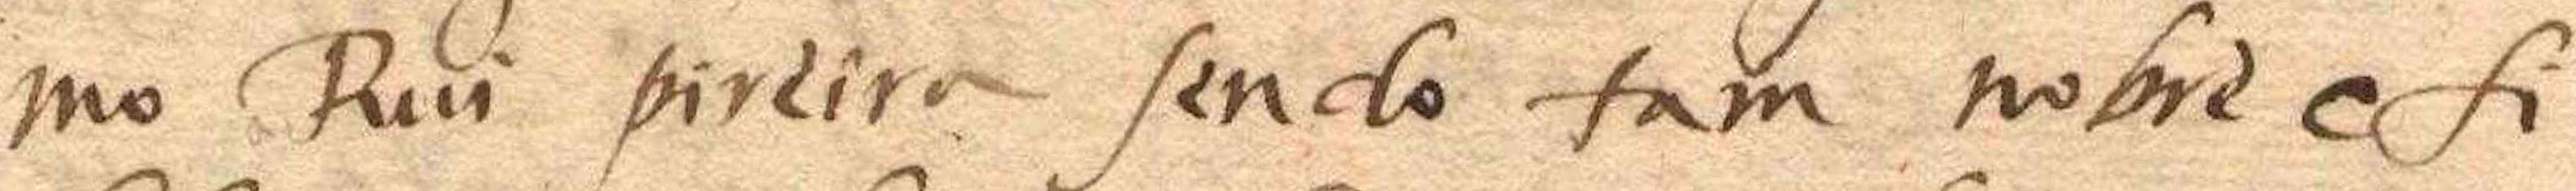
mo Rui pireira sendo tam nobre e fi
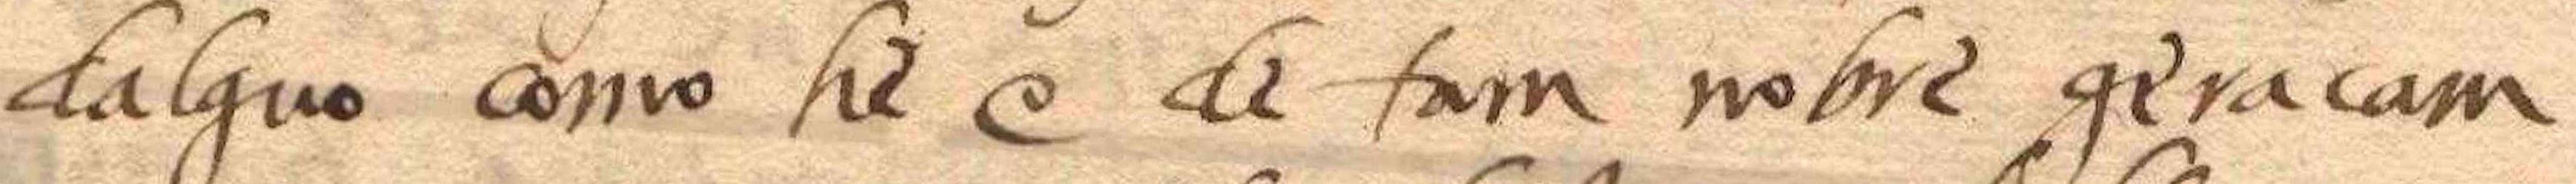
dalguo como he e de tam nobre geracam
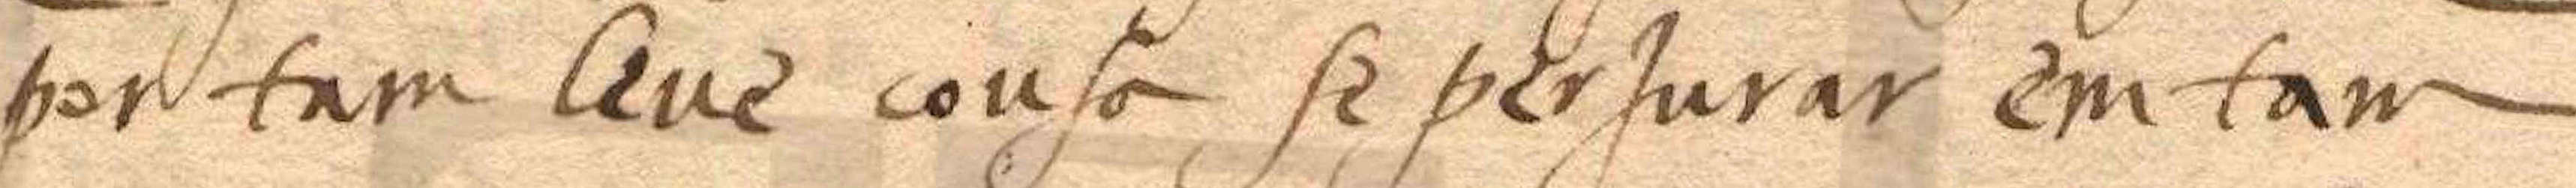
por tam leue cousa se perJurar em tam
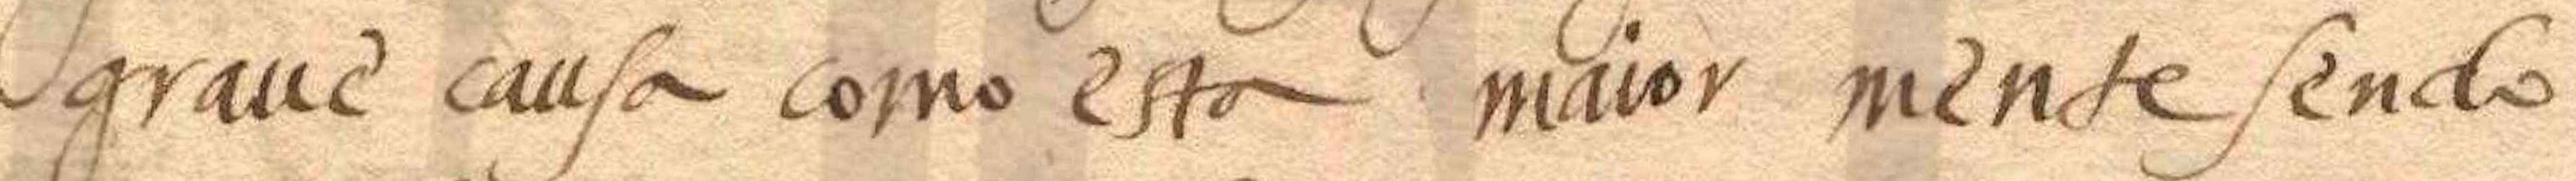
graue causa como esta maior mente sendo
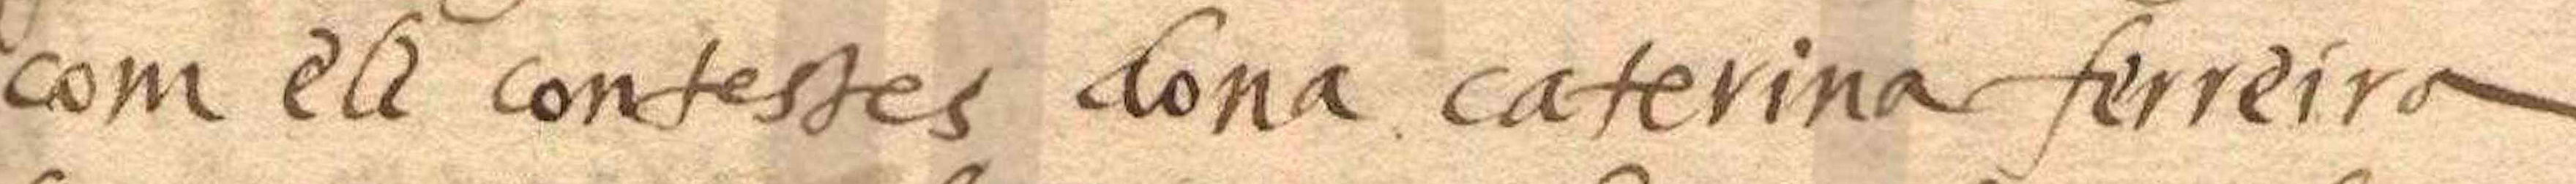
com ele contestes dona caterina ferreira
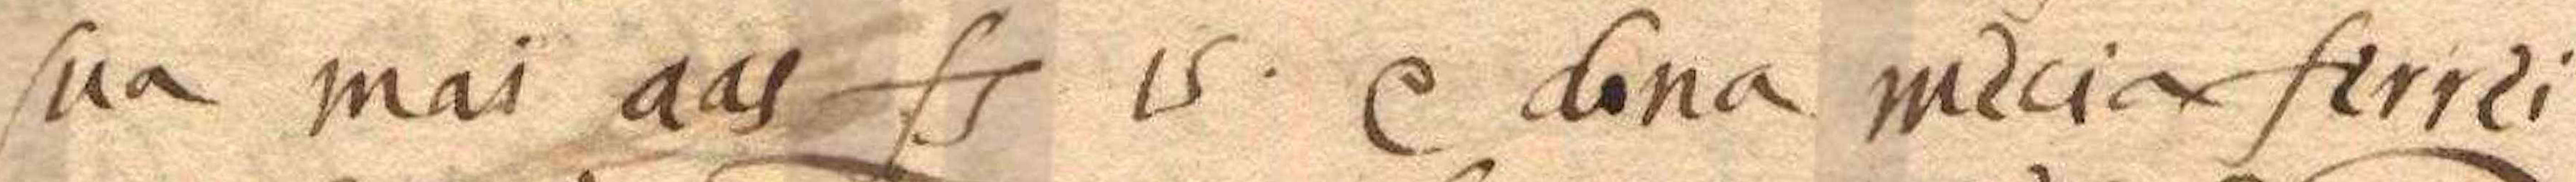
sua mai aas fꝭ 15. e dona mecia ferrei
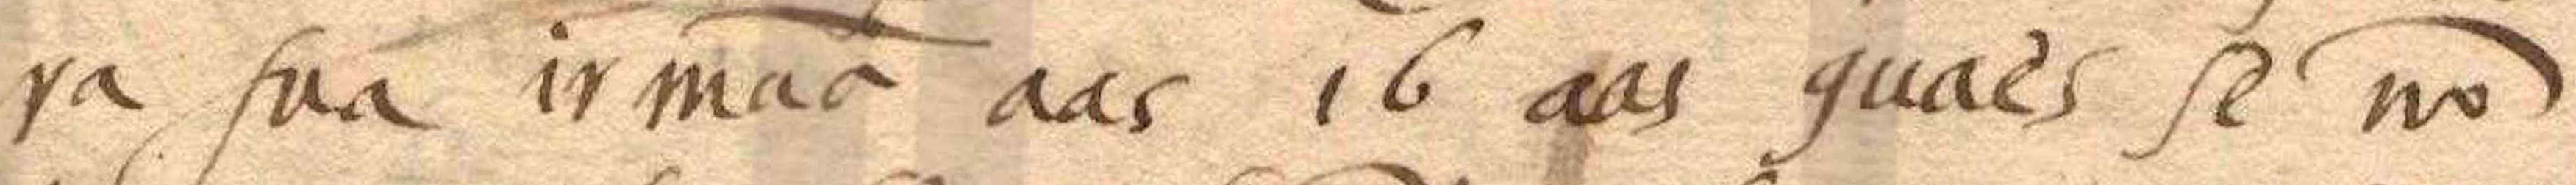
ra sua irmãa aas 16 aas quaes se n̄o
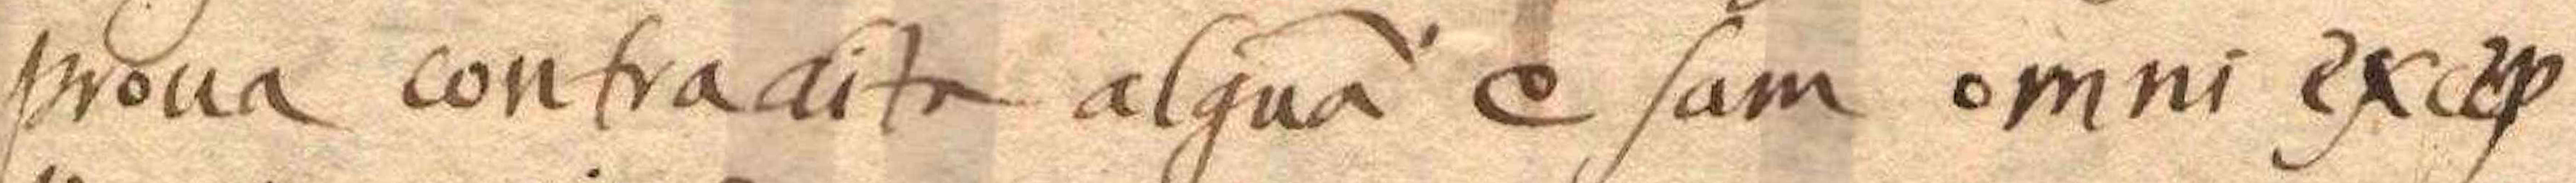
proua contradita algūa e sam omnis excep
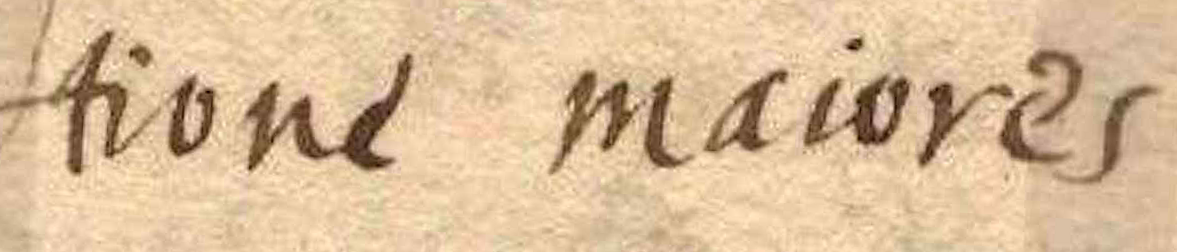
tione maiores
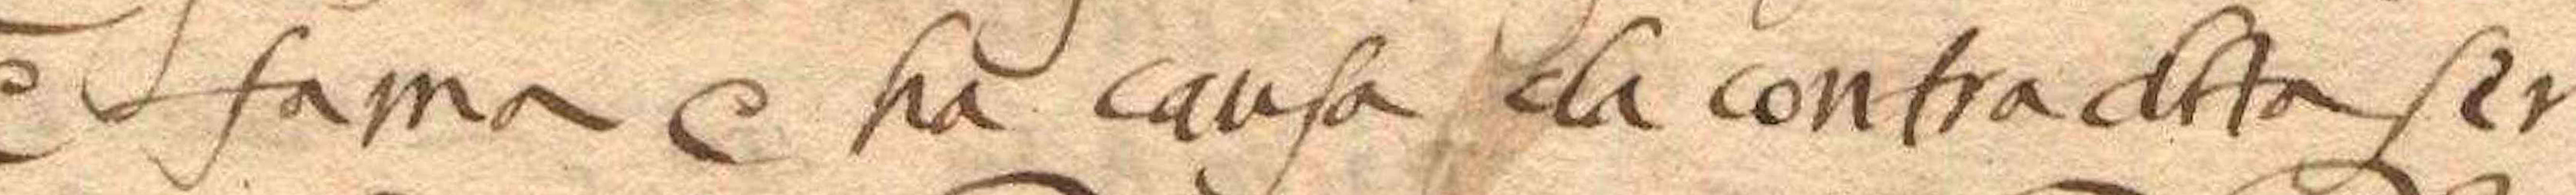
e fama e ha causa da contradita ser
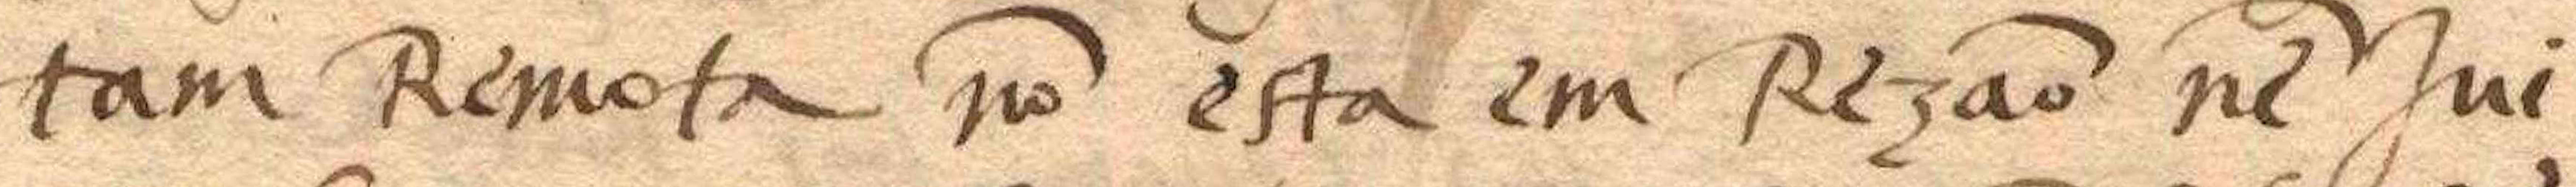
tam Remota n̄o esta em Rezão nē Jui
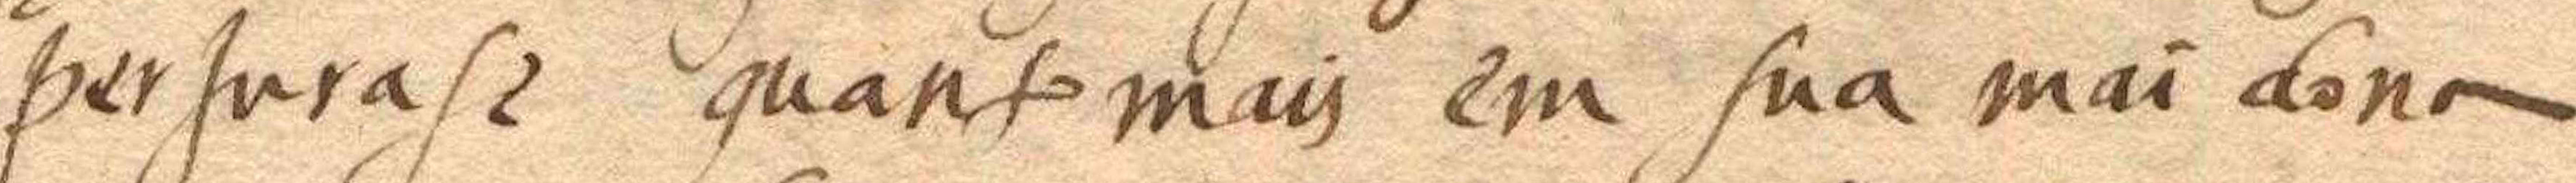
perJurase quanto mais em sua mai dona
